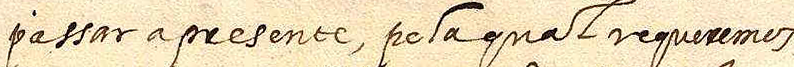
passar a presente, pela qual requeremos
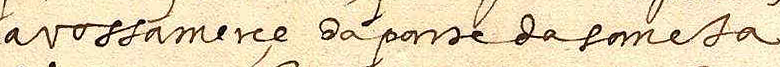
a vossa merçe da parte da sancta
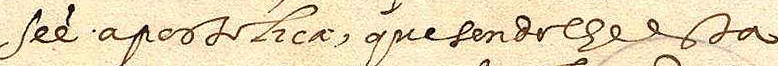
seé apostolica, que sendolhe esta
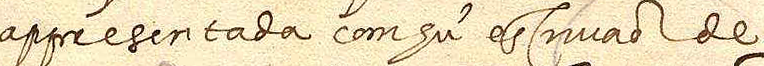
appresentada com hū esCriuaõ de
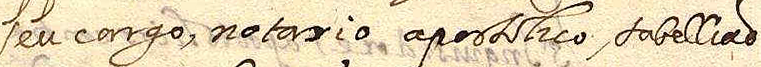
seu cargo, notario apostolico, tabelliaõ
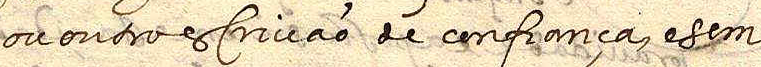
ou outro esCriuaõ de confiança, e sem
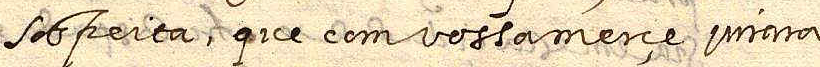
sospeita, que com vossa merçe jurara
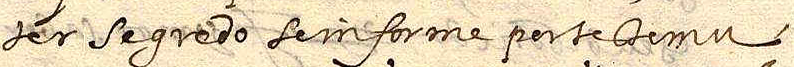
ter segredo se informe por testemu
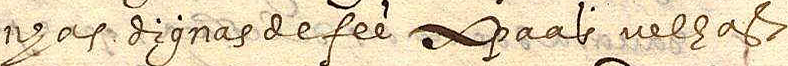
nhas dignas de feé Xpaãs uelhas
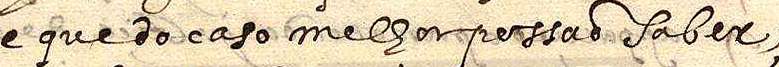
e que do caso melhor possaõ saber,
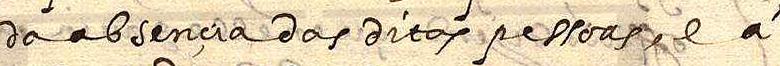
da absençia das ditas pessoas, e á
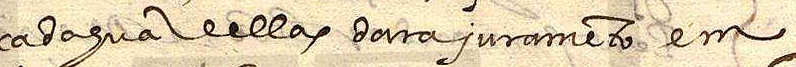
cada huā dellas dara juramēto em
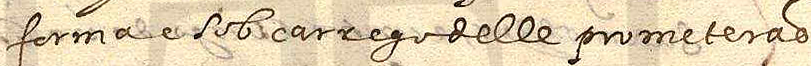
forma e sob carrego delle prometeraõ
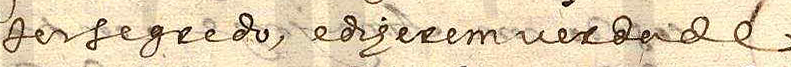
ter segredo, e dizerem uerdade
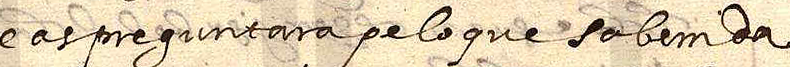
e as preguntara pelo que sabem da
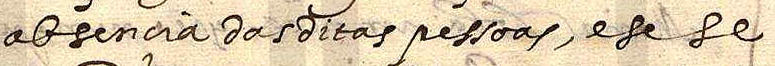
absençia das ditas pessoas, e se se
